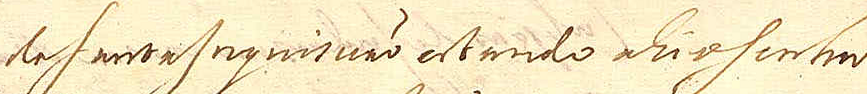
da Santa Jnquisicaõ estando ahi o Senhor
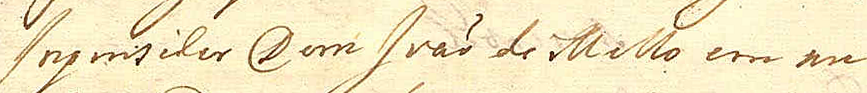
Jnquisidor Dom Joaõ de Mello em au
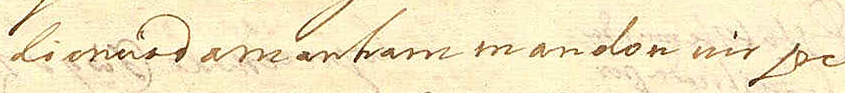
diencia da manham mandou uir pe
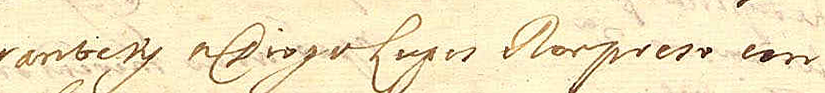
rante sy a Diogo Lopes Reo preso con
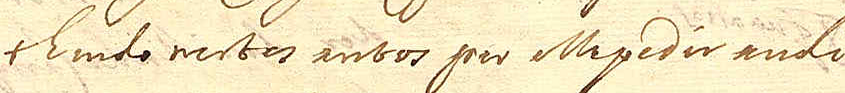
theudo nestes autos por elle pedir audi
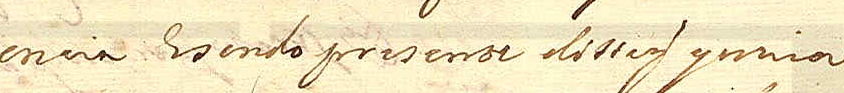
encia E sendo presente disse q̄ queria
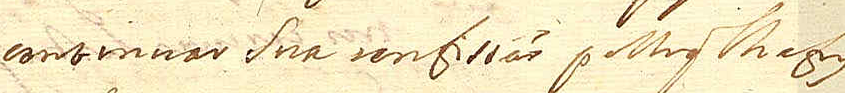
continuar sua confissaõ pello q̄ lhe foy
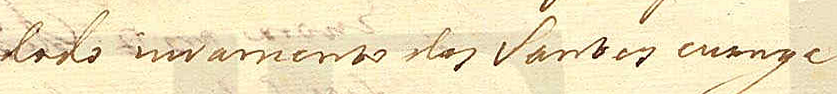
dado iuramento dos Santos euange
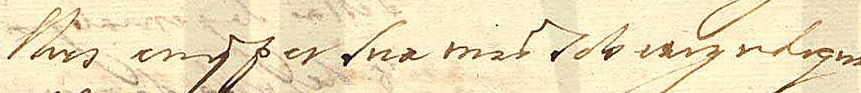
lhos em q̄ pos sua maõ sob cargo do qua
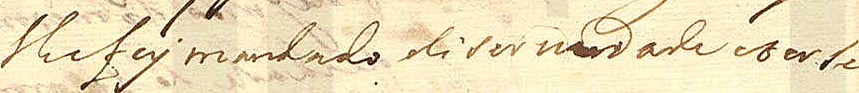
lhe foy mandado diser uerdade e ter se
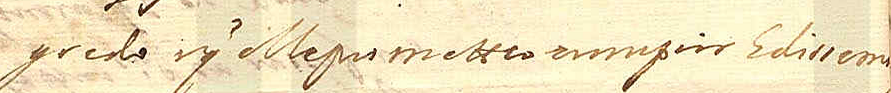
gredo o q̄ elle prometteo cumprir E dissem
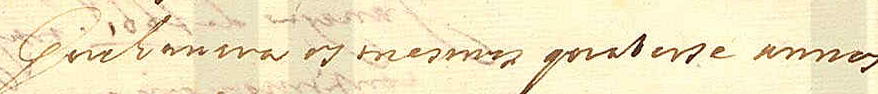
Que hauera os mesmos quatorse annos
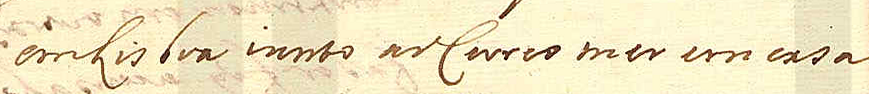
em Lisboa iunto ao Correo mor em casa
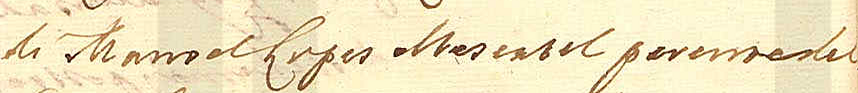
de Manoel Lopes Moscatel parente del
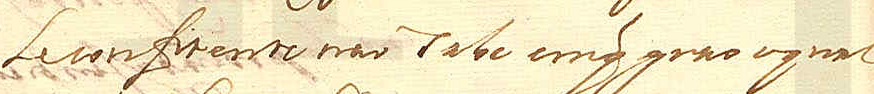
le confitente naõ sabe em q̄ grao o qual
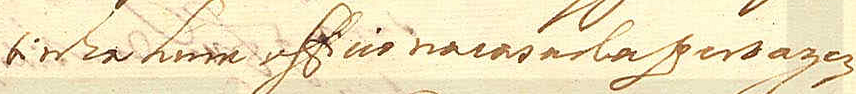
tinha hum officio na casa da portagen
